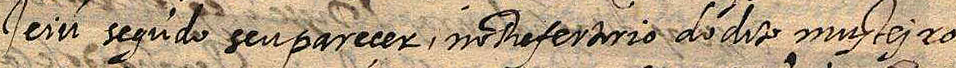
Jeiu̅ segu̅do seu pareçer, no Refertorio do dito mustejro
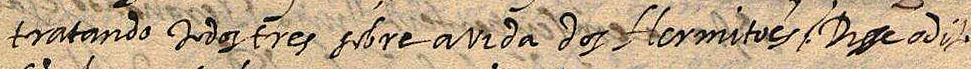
tratando todos tres sobre a vida dos Hermitões /. Disse o dito
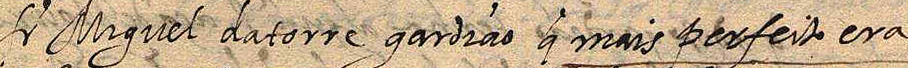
fr̅ Miguel da torre gardião q̅ mais perfeito era
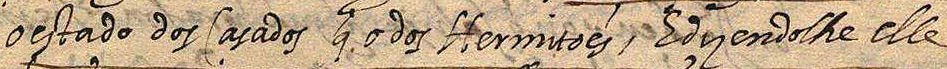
o estado dos Casados q̅ o dos Hermitões, E dizendolhe elle
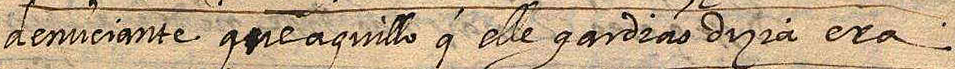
denunciante que aquillo q̅ elle gardião dizia era
